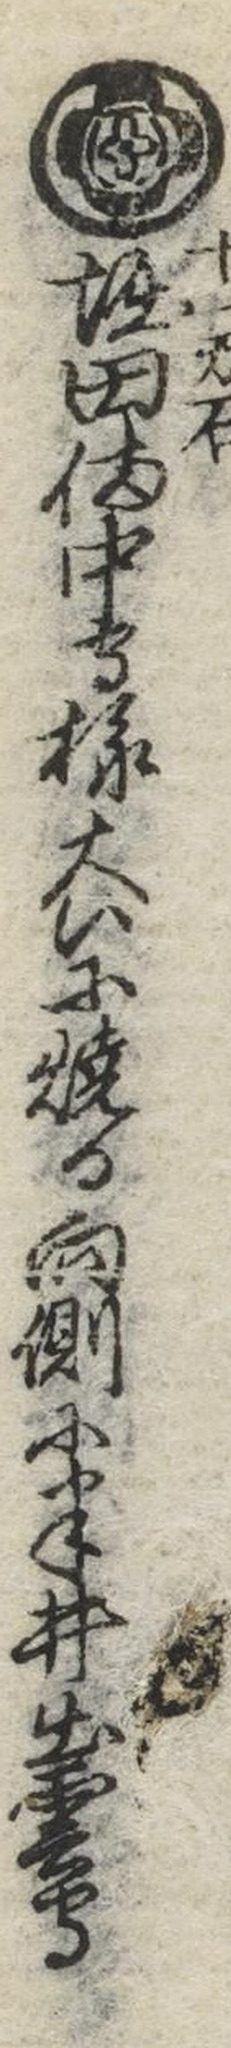堀田備中守様大いに焼る向側に半井出雲守
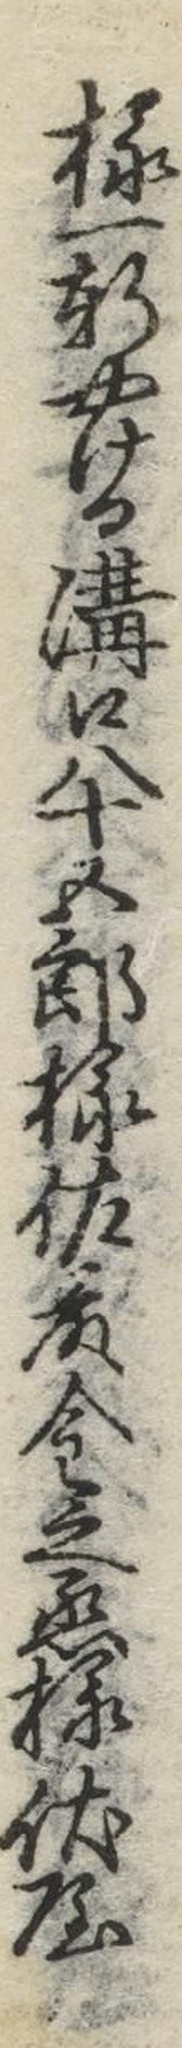様一軒やける溝口八十五郎様佐藤金之丞様伏屋
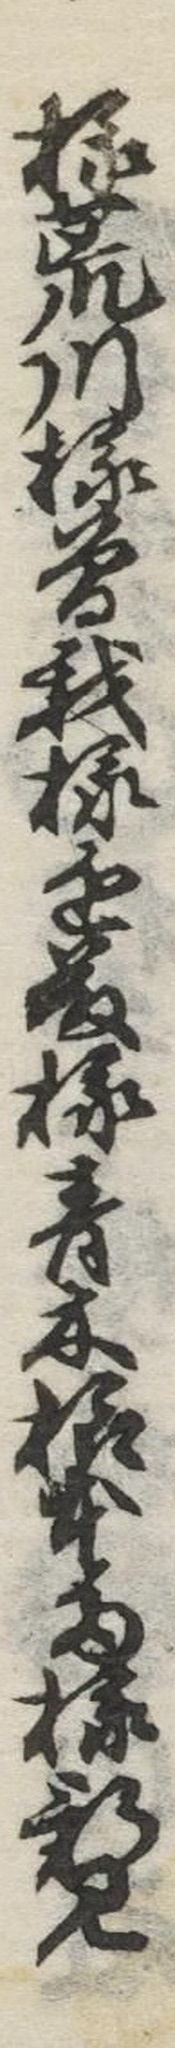様荒川様曽我様近藤様青木様本多様新見
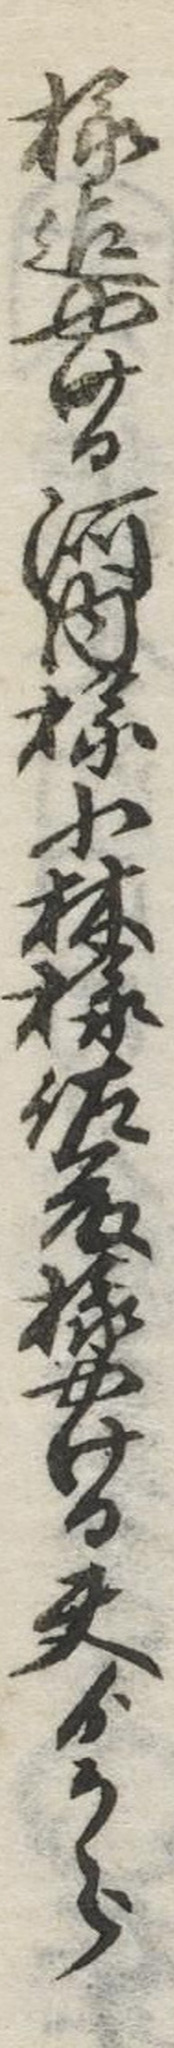様迄やける河内様小林様佐藤様やける夫ゟうら
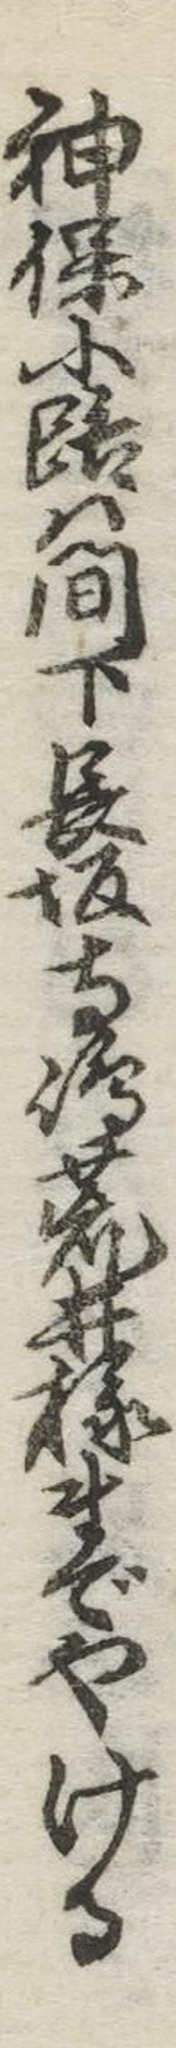神保小路ハ間下長坂寺嶋荒井様までやける
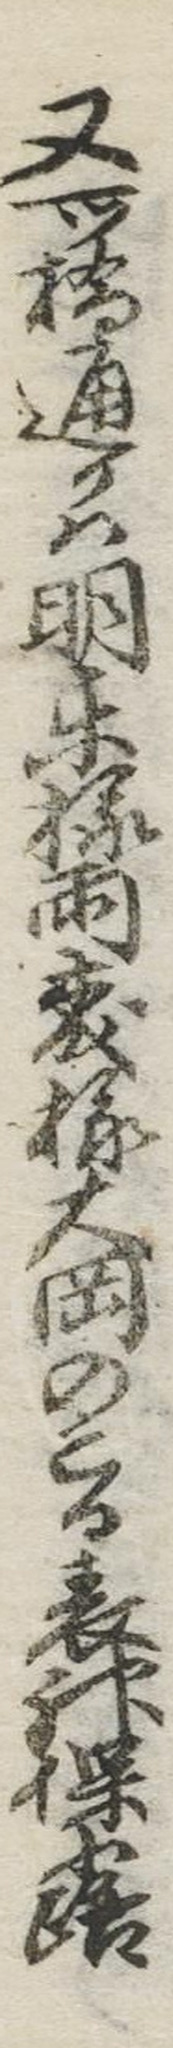又一ツ橋通りハ明楽様両森様大岡のこる表神保小路
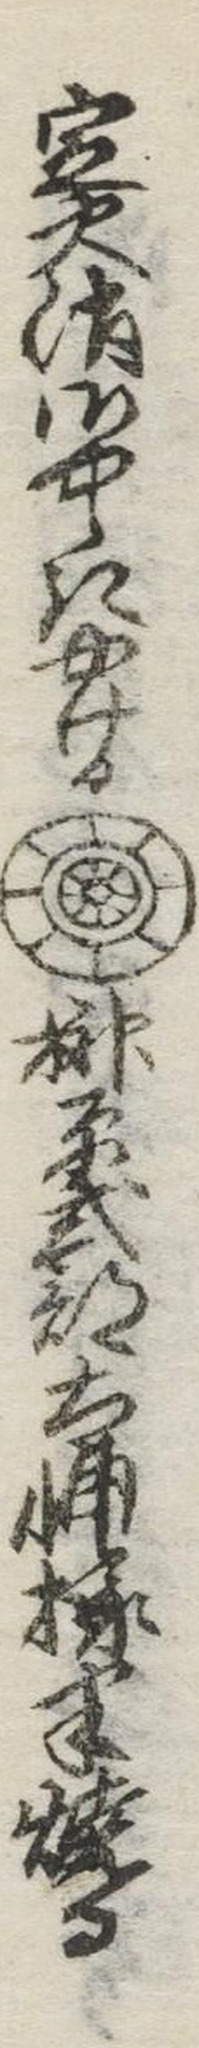定火消御やしきやける榊原式部大輔様半焼る
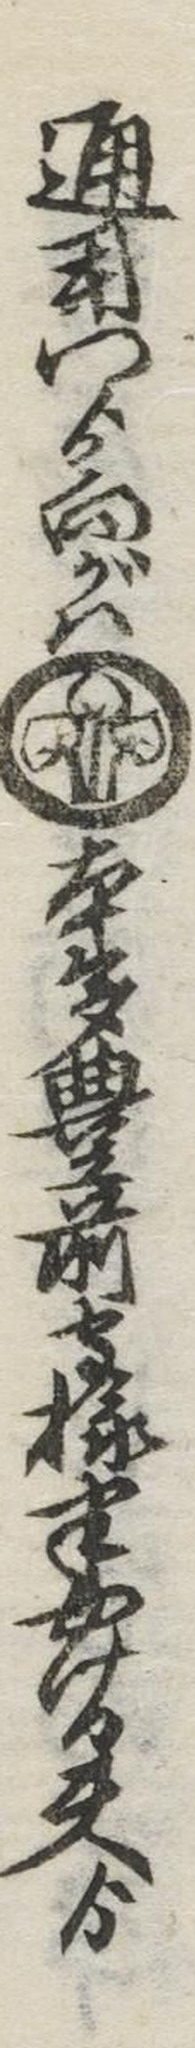通用門ゟ向ガハ本多豊前守様半やける夫ゟ
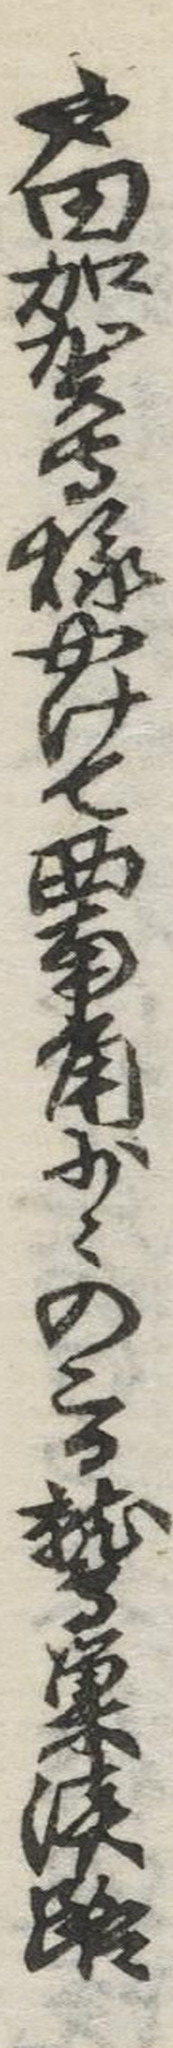戸田加賀守様やけて西南角少〻のこる鷲巣淡路
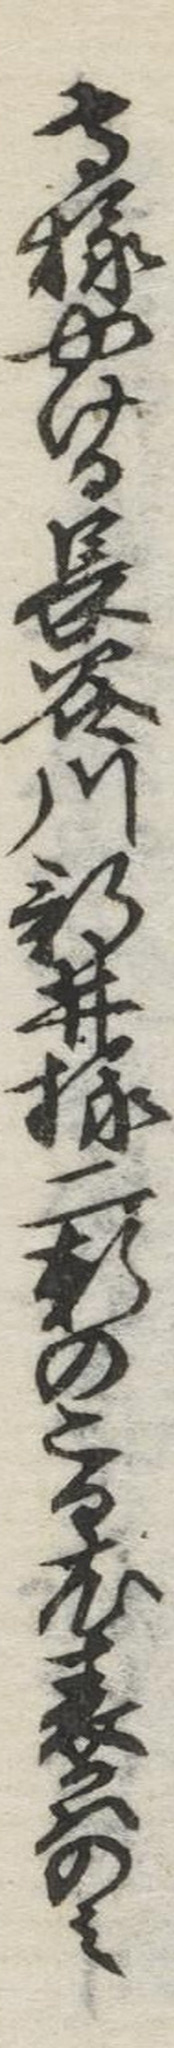守様やける長谷川荒井様二軒のこる尤表かハのミ
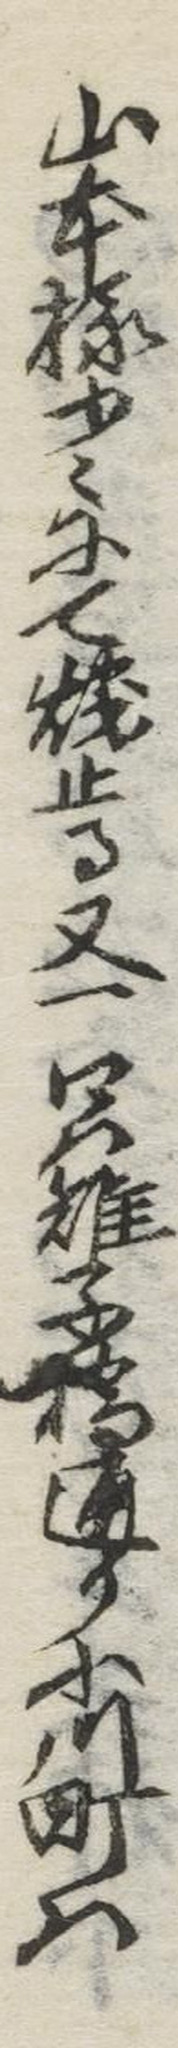山本様少〻にて焼止る又一口ハ雉子橋通り小川町ハ
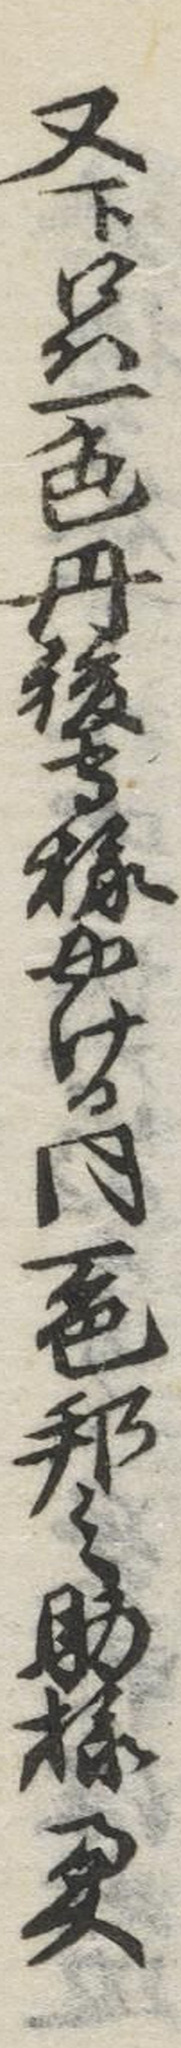又一ト口ハ一色丹後守様やける内一色邦之助様奥
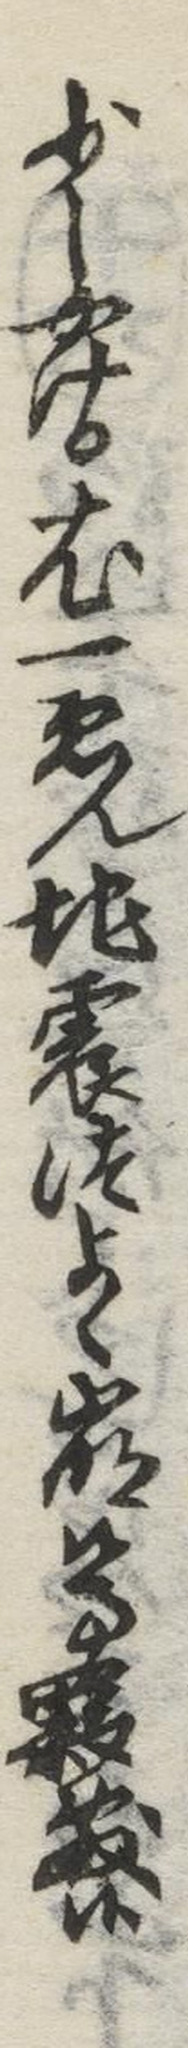少しやける尤一めん地震つよく崩候事夥敷候
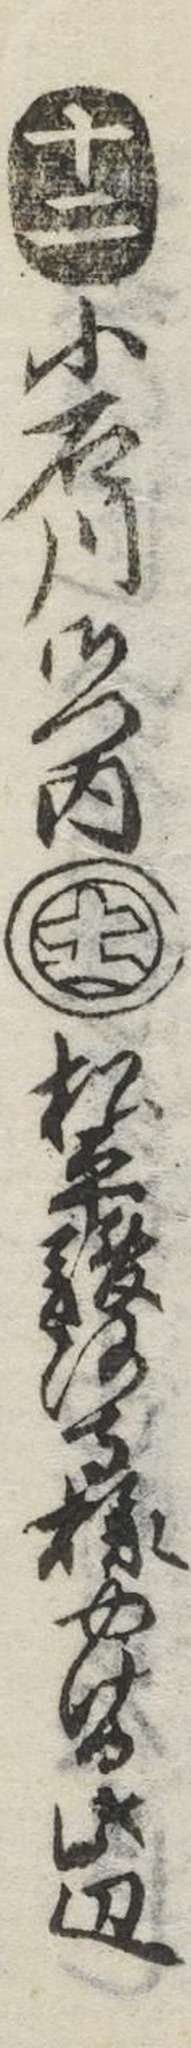十二小石川御門内松平駿河守様やける此辺
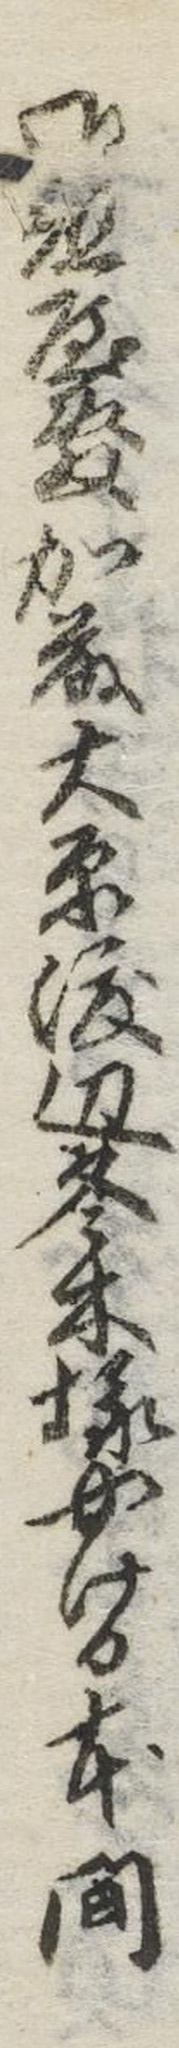御組屋敷加藤大原渡辺冬木様やける本間
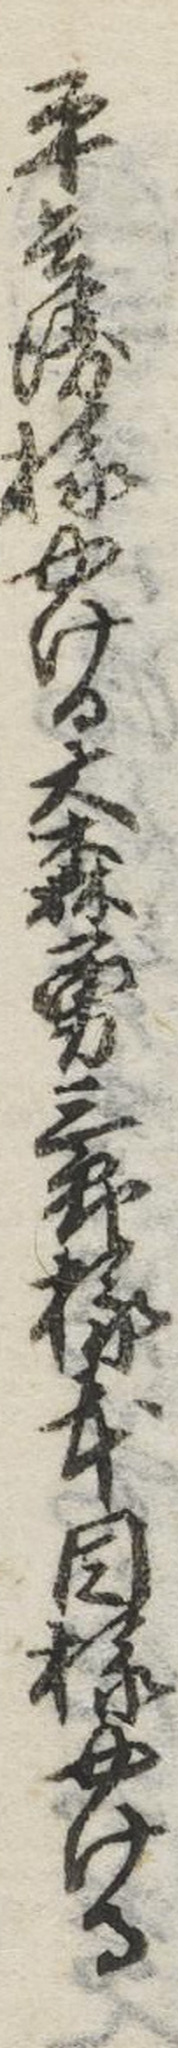平兵衛様やける大森勇三郎様本目様やける
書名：江戸御屋鋪方町方共　地震類焼場所巨細書之寫　潰家潰土蔵共取調附街道筋近在迄
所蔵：東京大学地震研究所図書室 Earthquake Research Institute Library, The University of Tokyo, JAPAN
